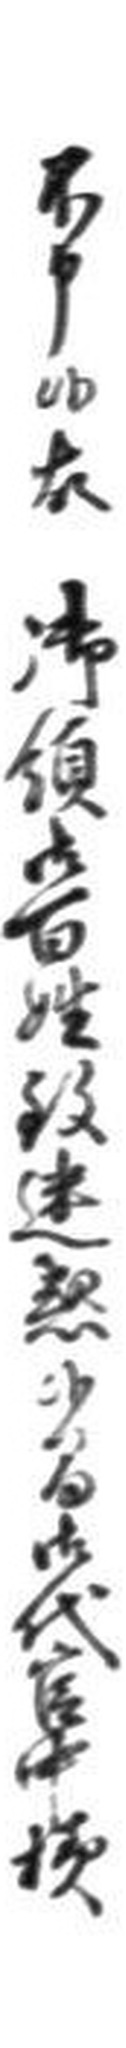不申候故御領御百姓致迷惑得候間御代官中様

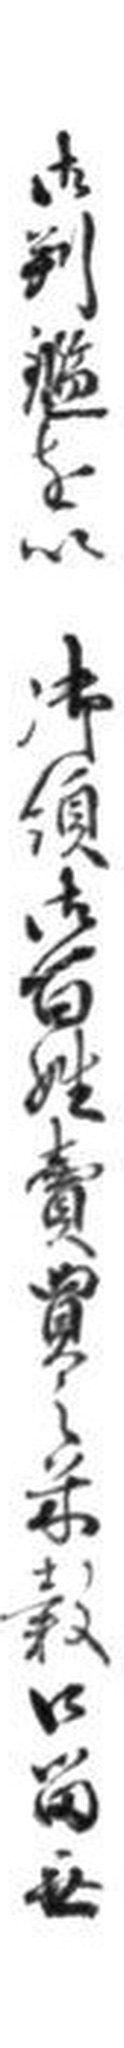御判鑑を以御領御百姓売買之米穀口留無
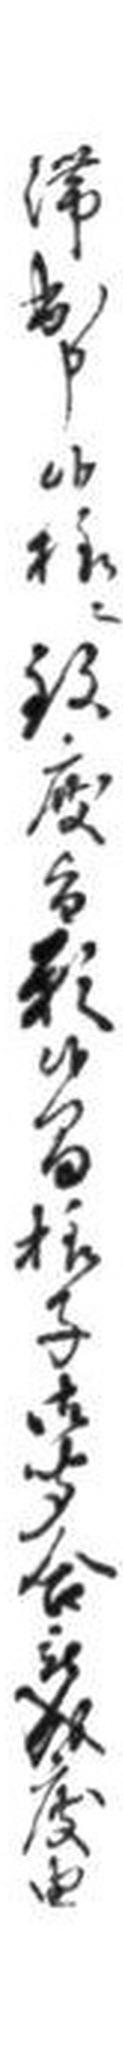滞出申候様ニ致度旨願候間様子御聞合被成度由
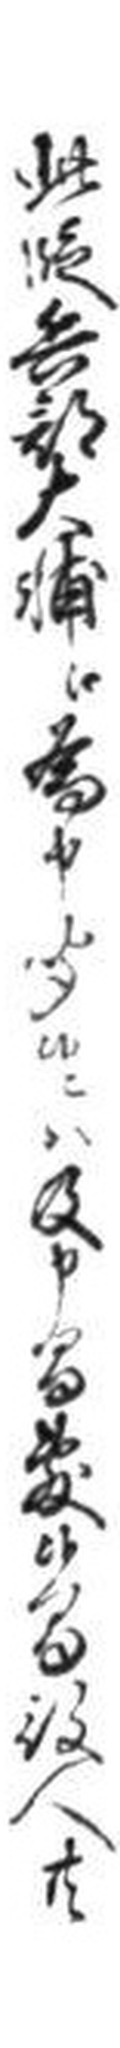此段兵部大輔江為申聞候ニハ及申間敷候間役人共
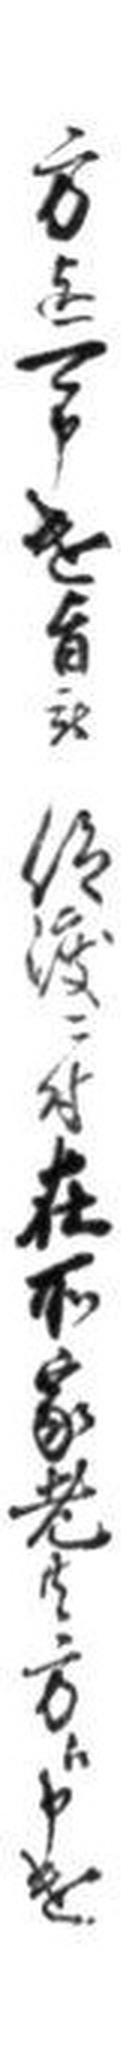方迄可申遣旨被仰渡ニ付在所家老共方江申遣
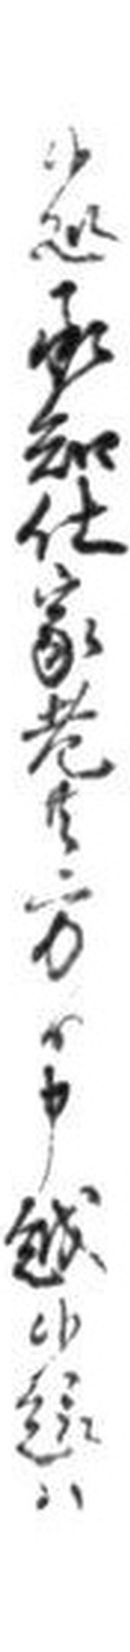候処承知仕家老共方ゟ申越候趣ハ
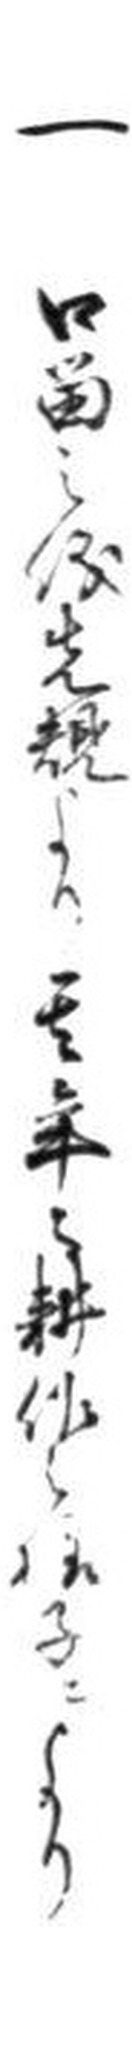一口留之儀先規より其年之耕作之様子ニより
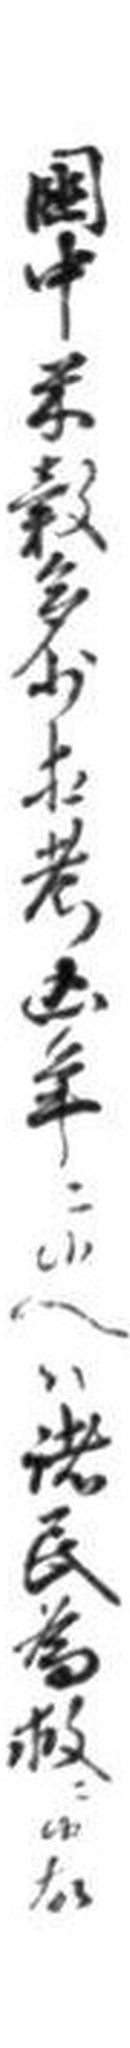国中米穀多少相考凶年ニ候ヘハ諸民為救ニ候故
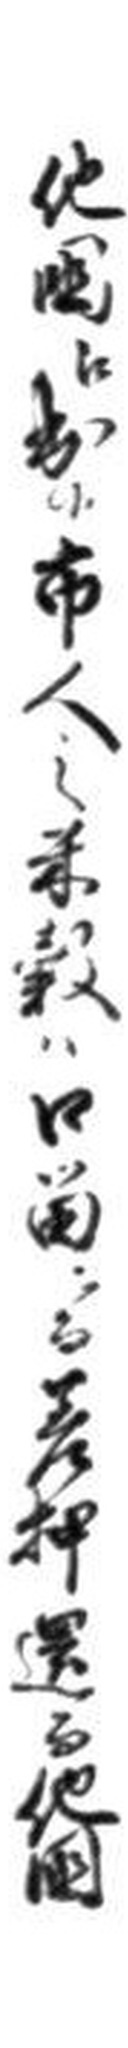他国江出候市人之米穀ハ口留ニ而差押還而他国
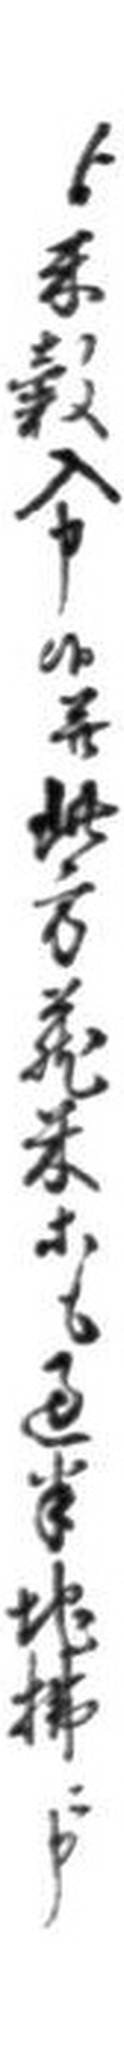ゟ米穀入申候并此方蔵米等も過半地払ニ申
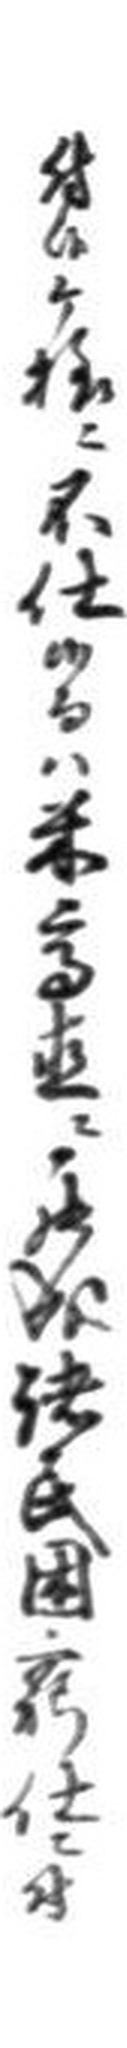付候ケ様ニ不仕候而ハ米高直ニ罷成諸民困窮仕ニ付
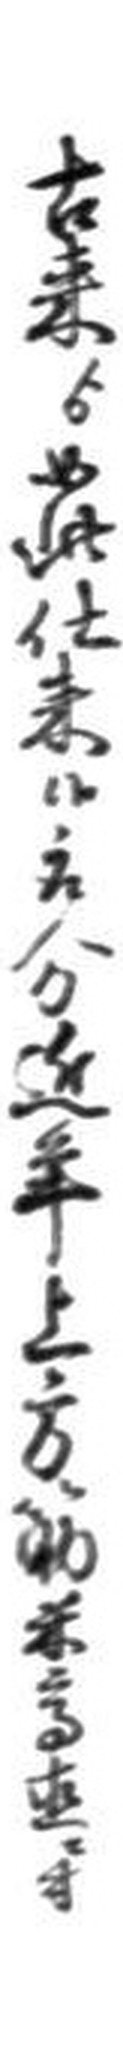古来ゟ如此仕来候取分近年上方筋米高直ニ付
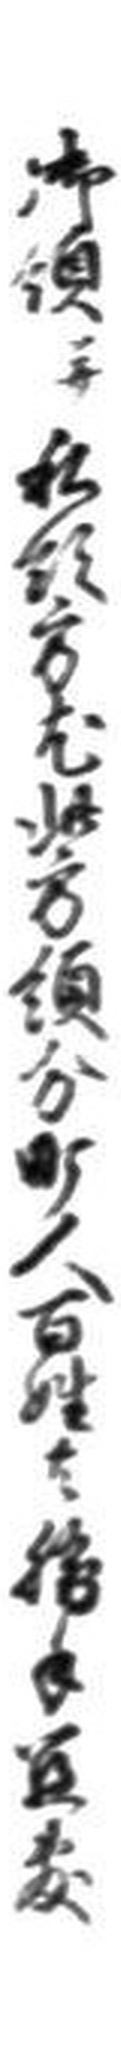御領并私領方尤此方領分町人百姓共勝手宜敷
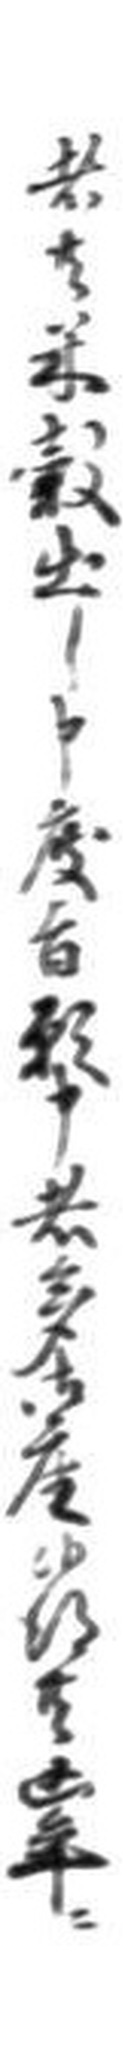者共米穀出し申度旨願申者多御座候得共凶年ニ
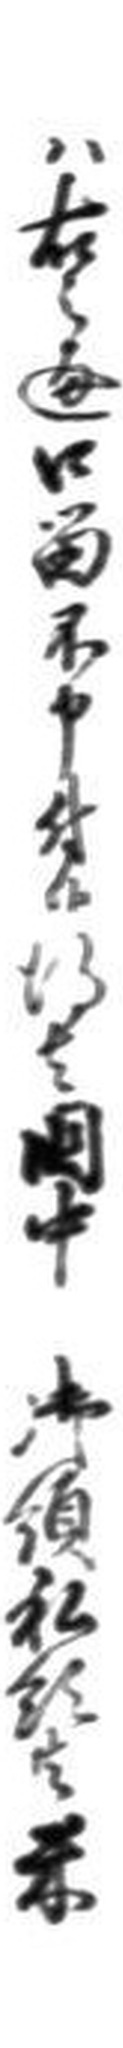ハ右之通口留不申付候得者国中御領私領共米
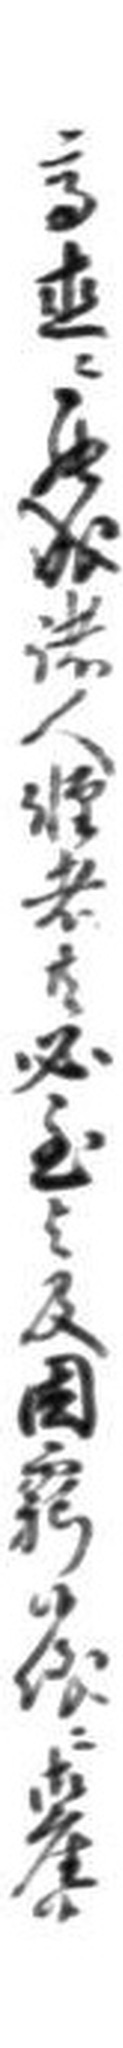高直ニ罷成諸人軽者共必至与及困窮候儀ニ御座候
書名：家譜 二十二 吉品公 従元禄十五年到同十六年
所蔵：福井県文書館 Fukui Prefectural Archives
